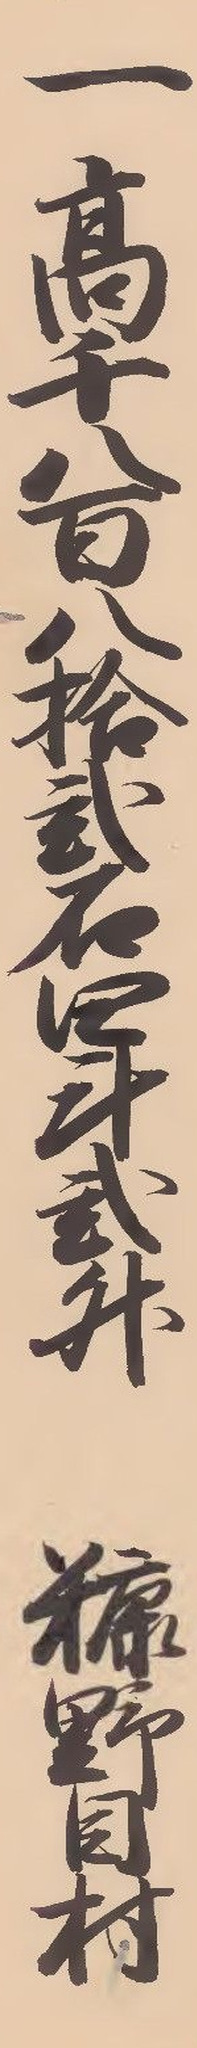一高千八百八拾弐石四斗弐升糖野目村

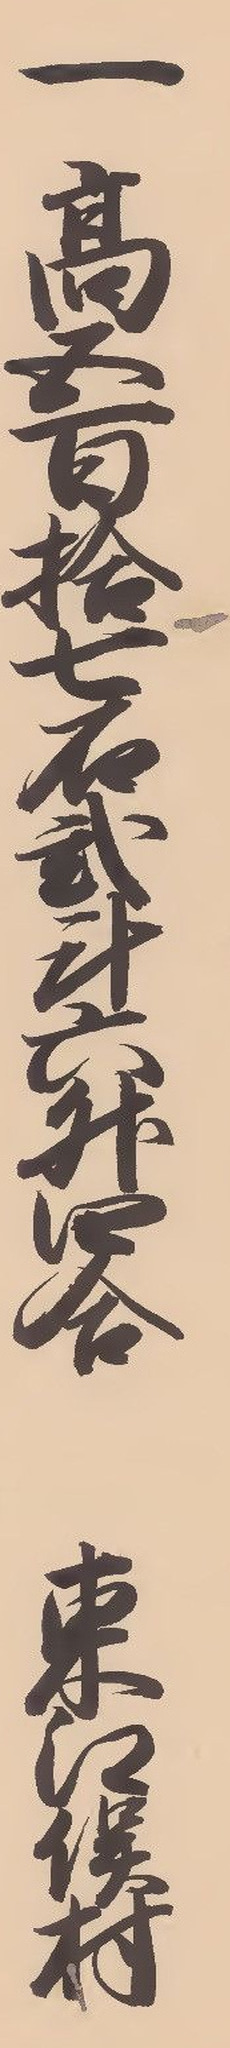一高五百拾七石弐斗六升四合東江俣村
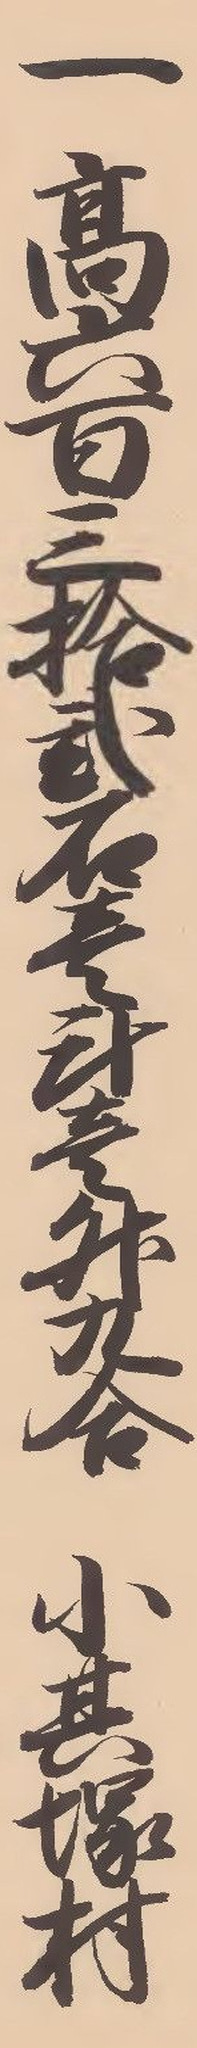一高六百三拾弐石壱斗壱升九合小其塚村
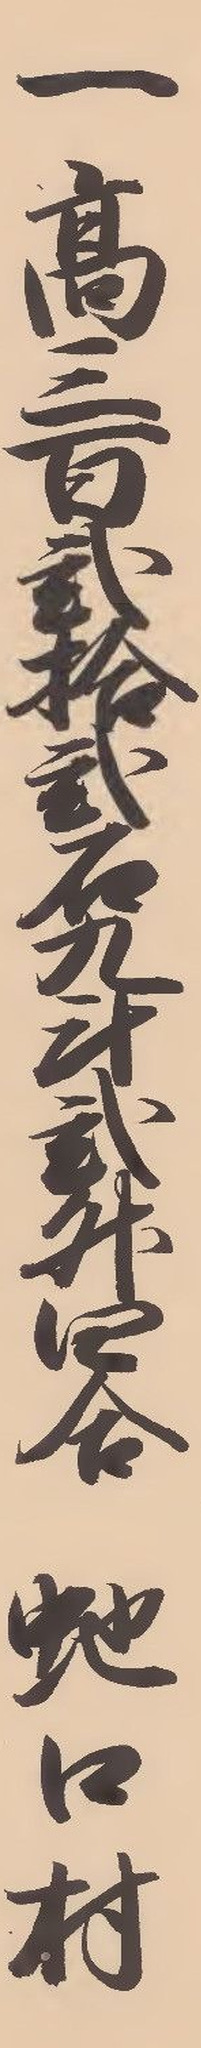一高三百弐拾弐石九斗弐升四合蛇口村
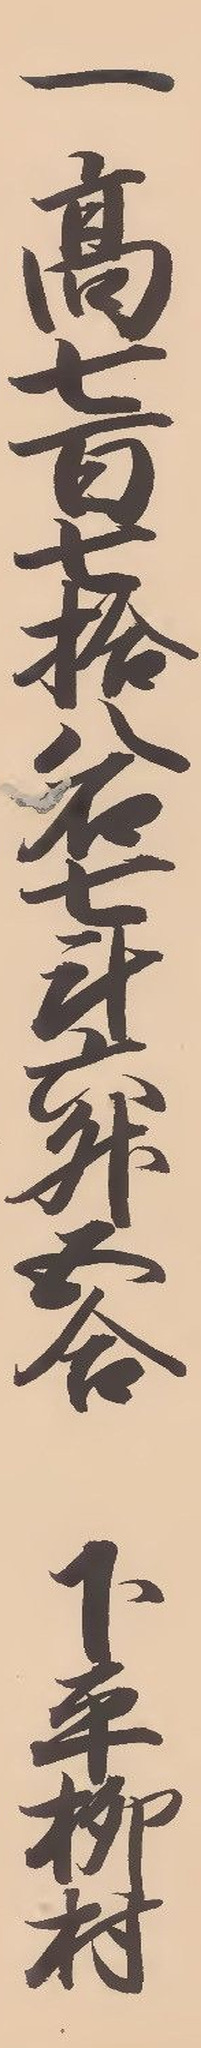一高七百七拾八石七斗六升五合下平柳村
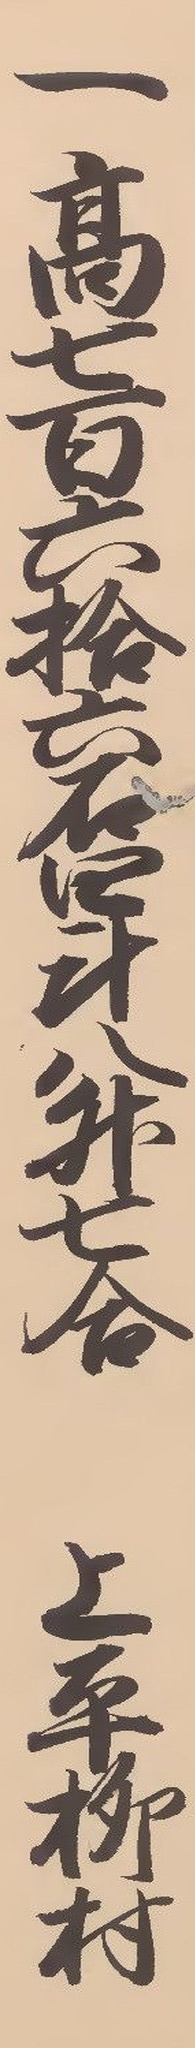一高七百六拾六石四斗八升七合上平柳村
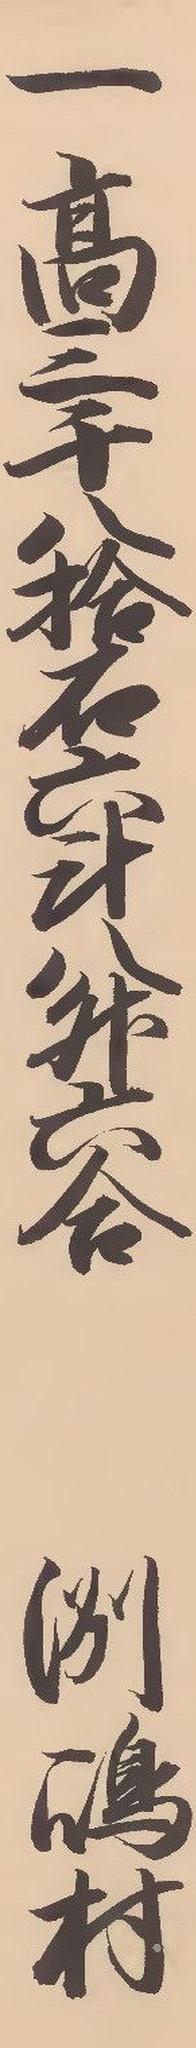一高三千八拾石六斗八升六合洲島村
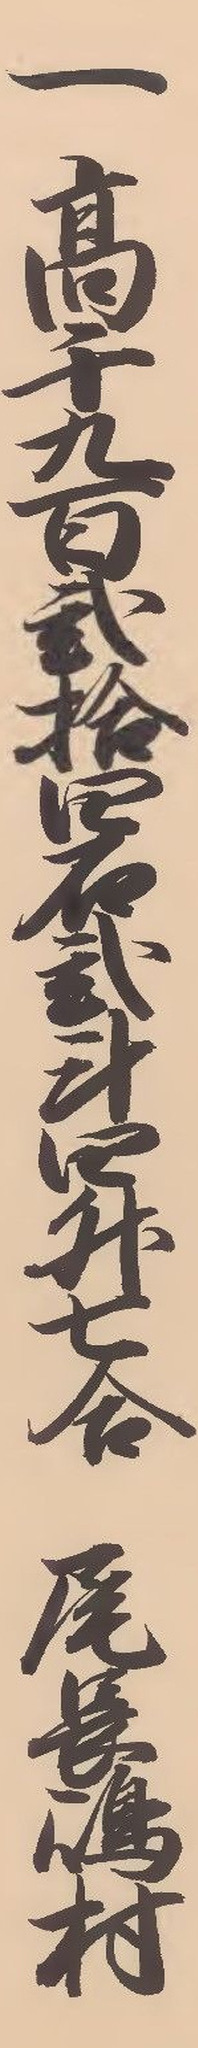一高千九百弐拾四石弐斗四升七合尾長島村
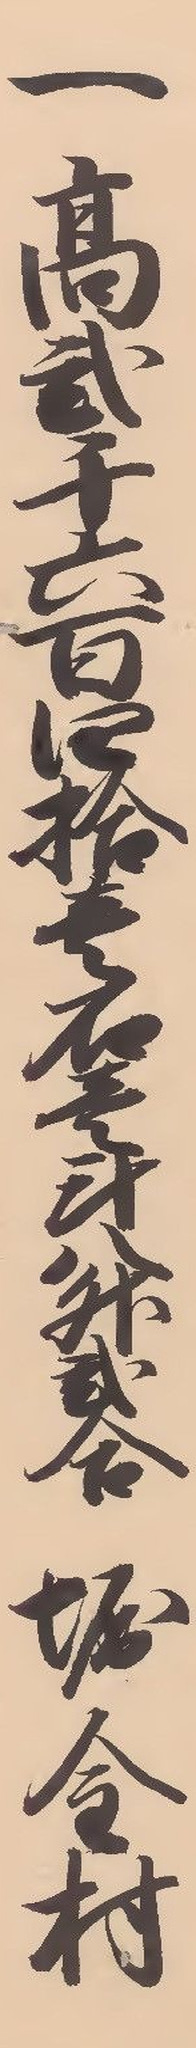一高弐千六百四拾壱石壱斗八升弐合堀金村

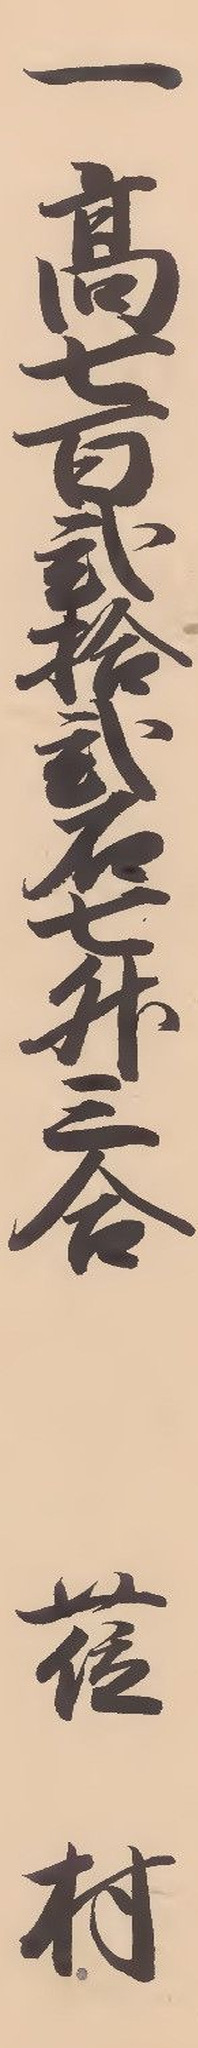一高七百弐拾弐石七升三合莅村
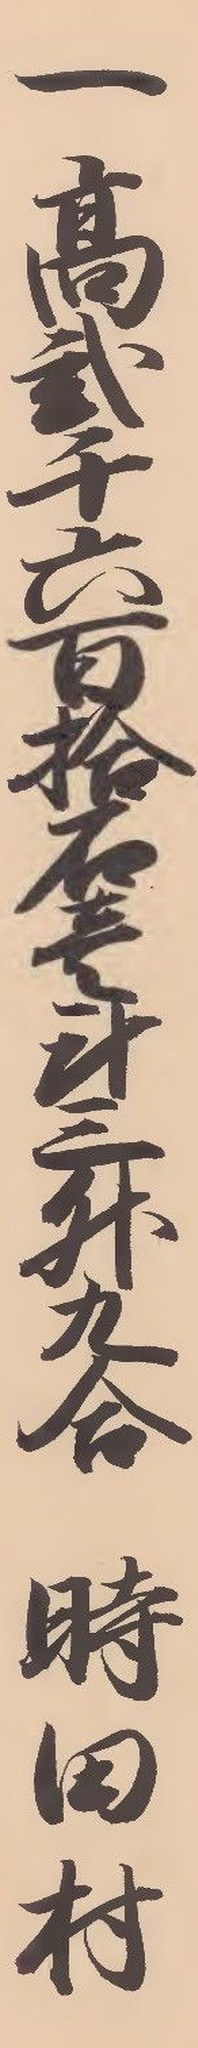一高弐千六百拾石壱斗三升九合時田村
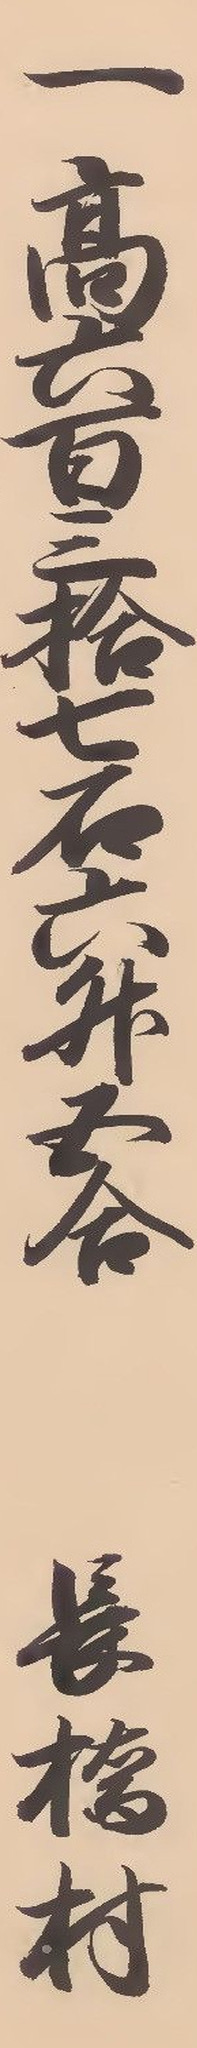一高六百三拾七石六升五合長橋村
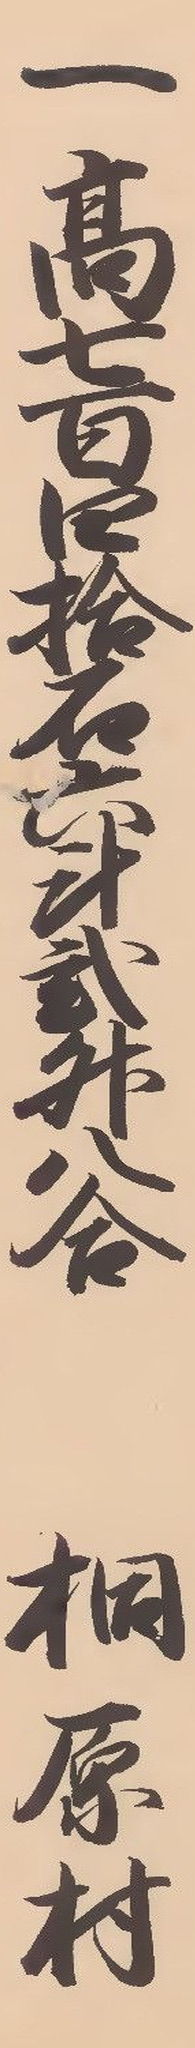一高七百四拾石六斗弐升八合桐原村
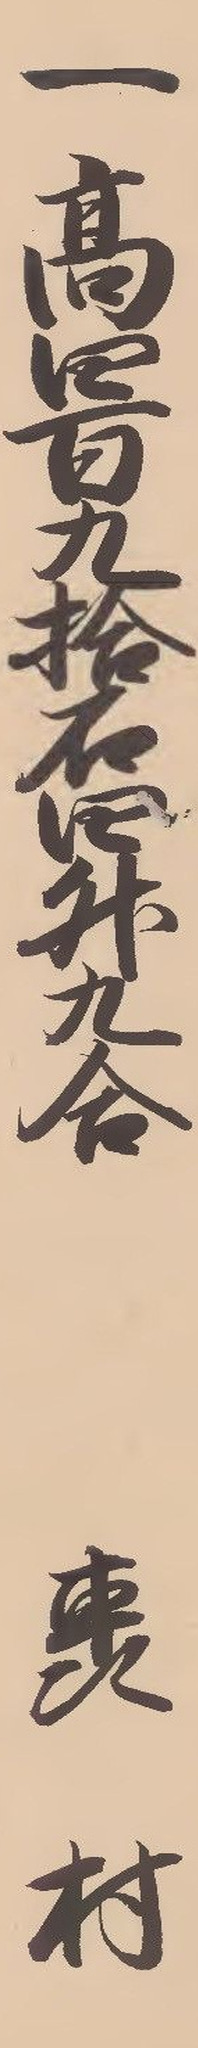一高四百九拾石四升九合轟村
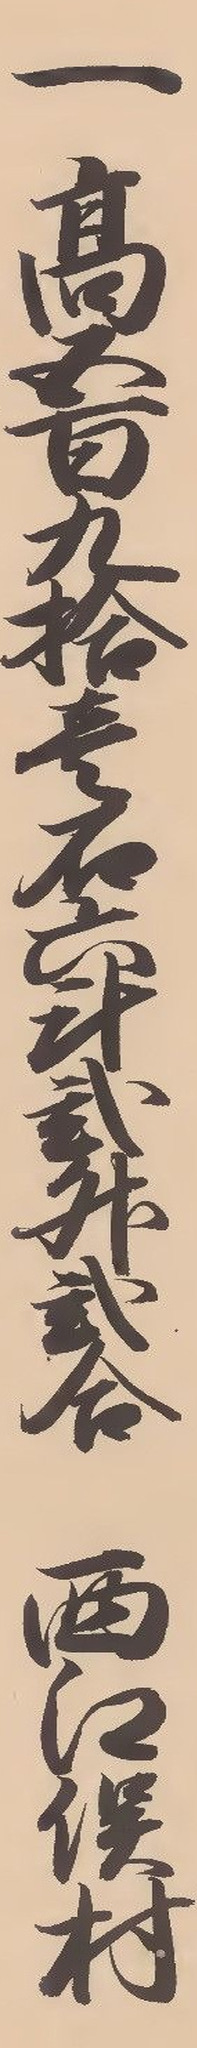一高五百九拾壱石六斗弐升弐合西江俣村
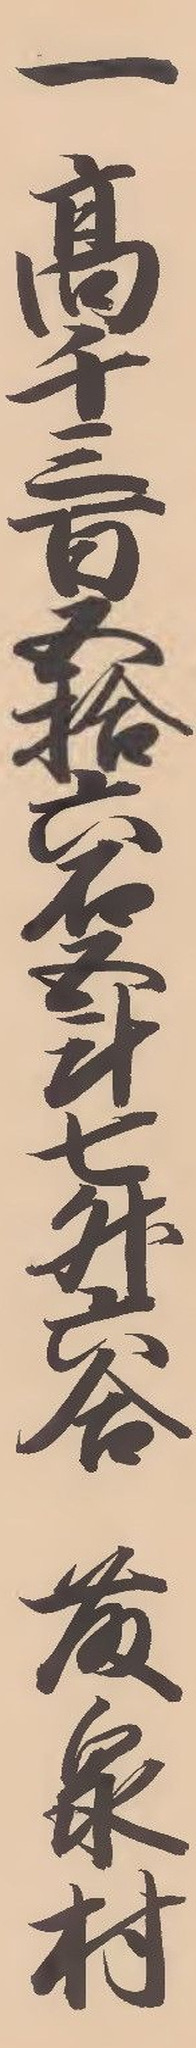一高千三百五拾六石五斗七升六合藤泉村
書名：出羽国郷帳　１
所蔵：国立公文書館 National Archives of Japan
